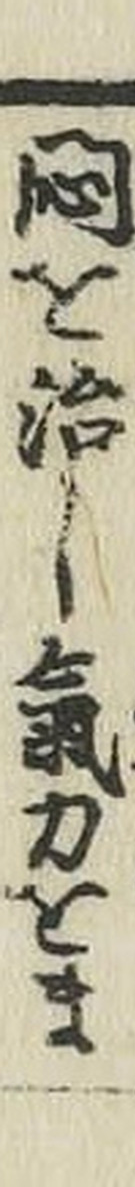悶を治し気力をま
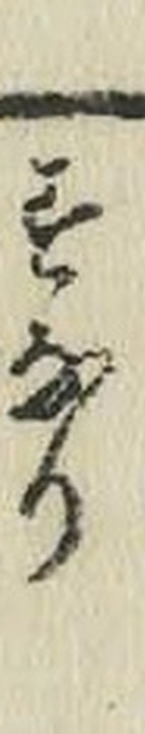すなり
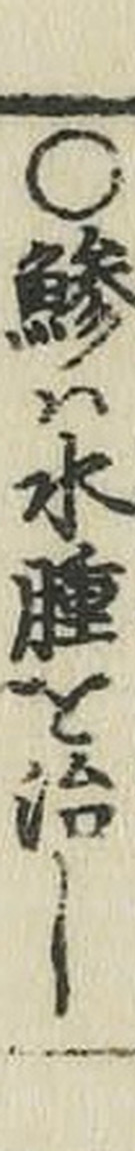○鯵は水腫を治し
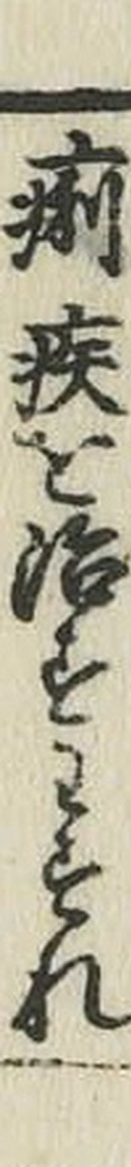痢疾を治すわすれ
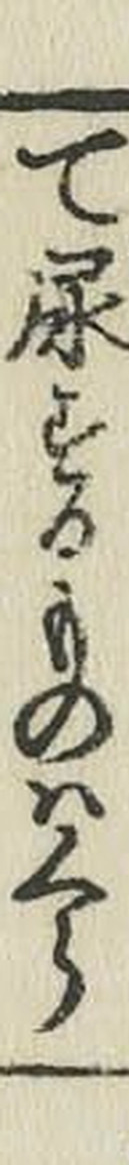て尿するものはくら
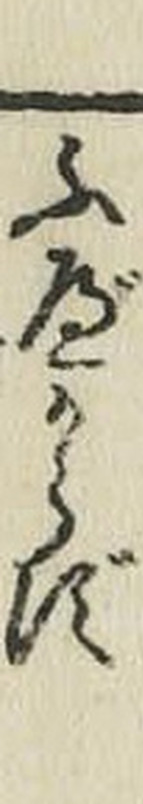ふべからず
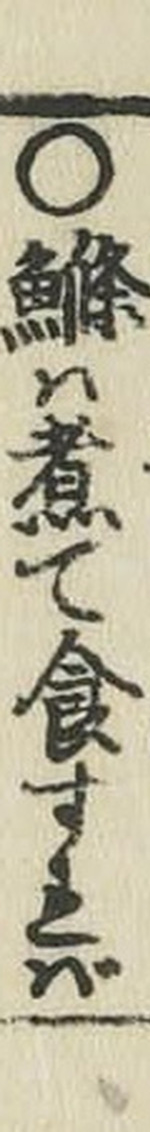○鰷は煮て食すれば
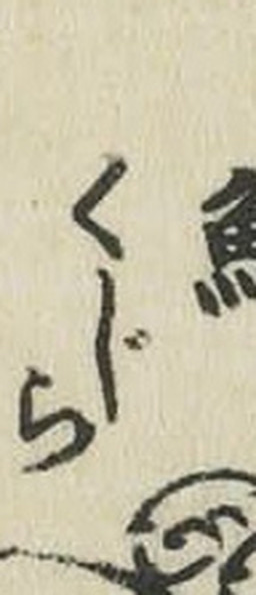くじら
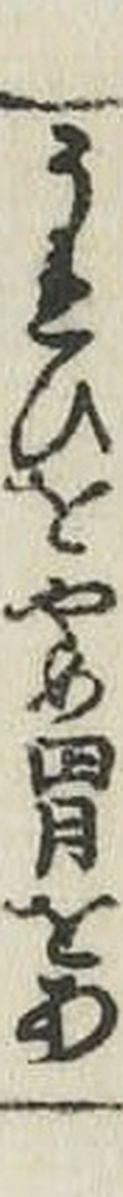うれひをやめ胃をあ
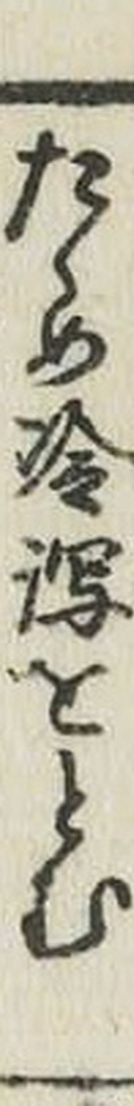たゝめ冷泻をとむ
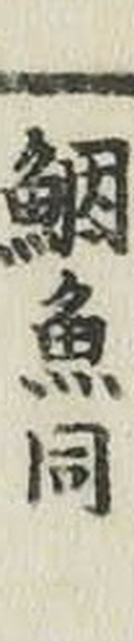鮂魚同
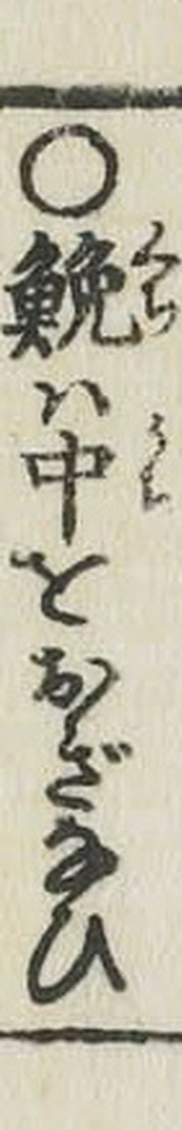○鮸は中をおぎなひ
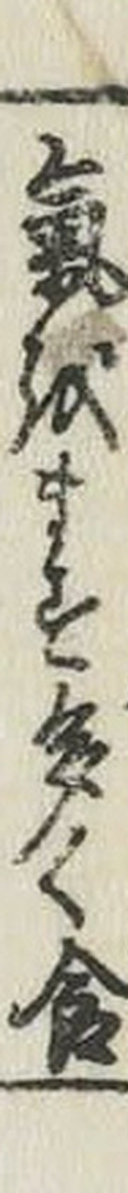気をます多く食
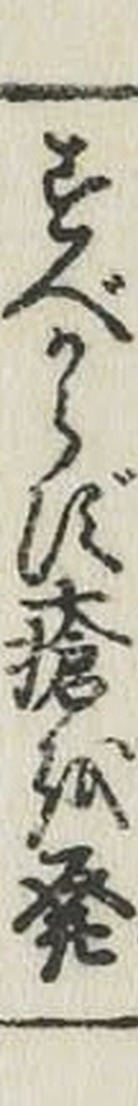すべからず瘡を発
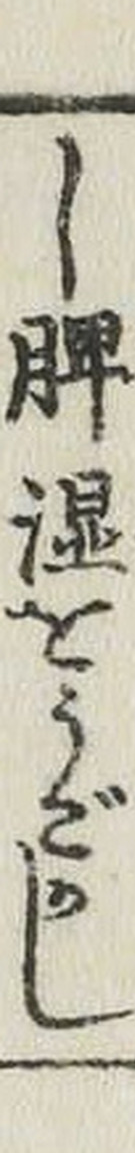し脾湿をうごかし
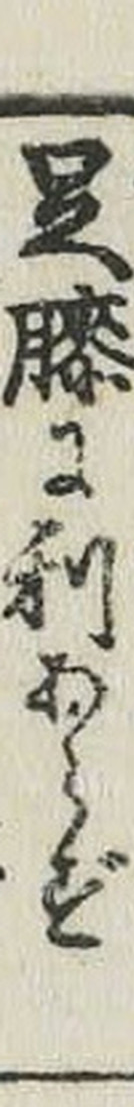足膝に利あらず
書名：増補頭書訓蒙図彙大成 10巻 7:巻之14-16
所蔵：東京学芸大学教育コンテンツアーカイブ
